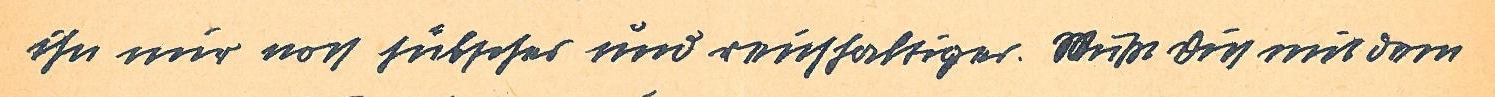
ihn mir noch hübscher und reichfarbiger. Mußt Dich mit dem
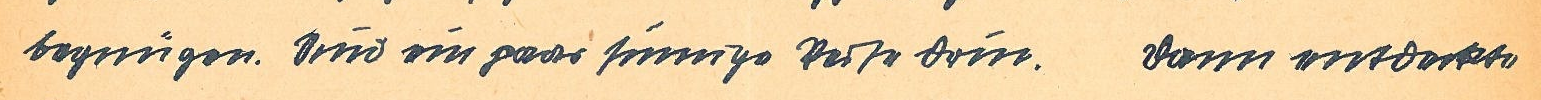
begnügen. Sind ein paar sinnige Verse drin. Dann entdeckte
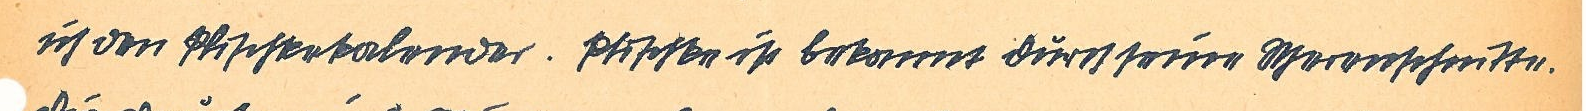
ich den Plischkekalender. Plischke ist bekannt durch seine Scherenschnitte.
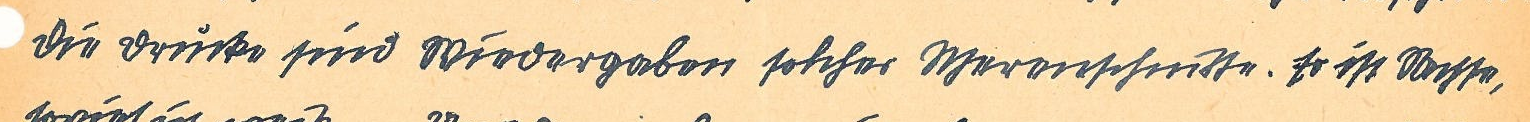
Die Drucke sind Wiedergaben solcher Scherenschnitte. Er ist Sachse,
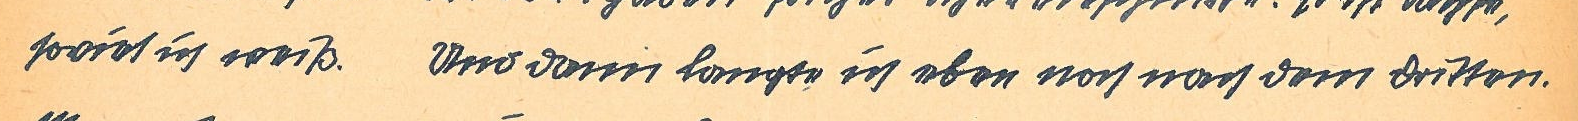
soviel ich weiß. Und dann langte ich eben noch nach dem dritten.
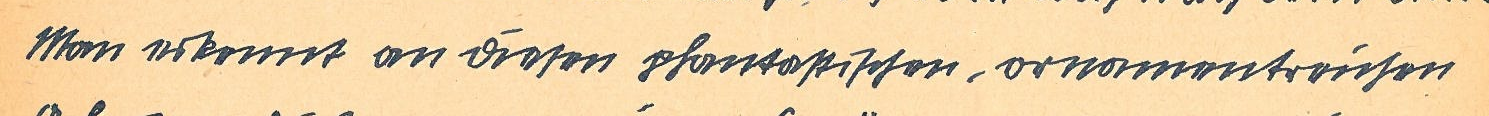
Man erkennt an diesen phantastischen, ornamentreichen
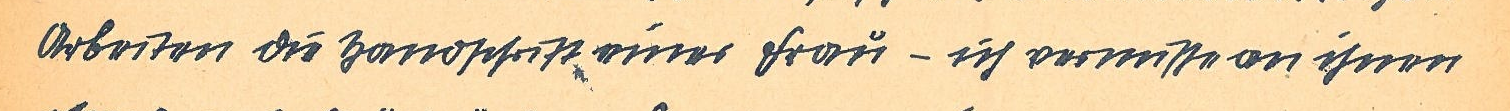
Arbeiten die Handschrift einer Frau – ich vermisse an ihnen
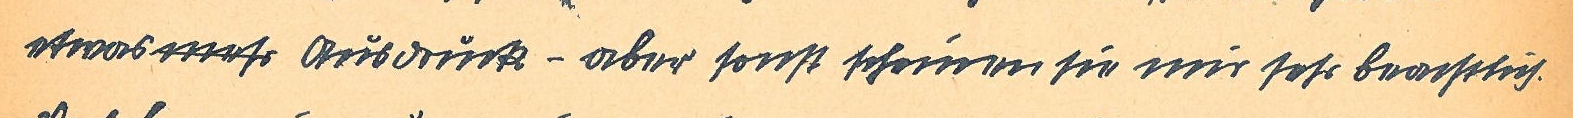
etwas mehr Ausdruck – aber sonst scheinen sie mir sehr beachtlich.
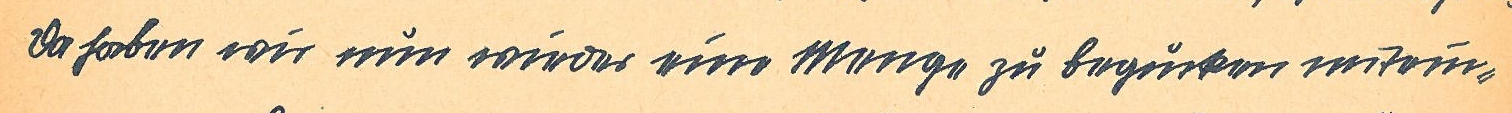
Da haben wir nun wieder eine Menge zu begucken mitein¬
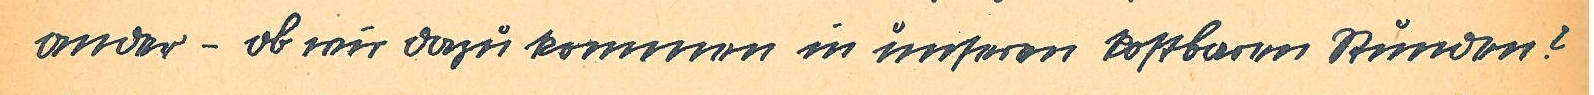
ander – ob wir dazu kommen in unseren kostbaren Stunden?
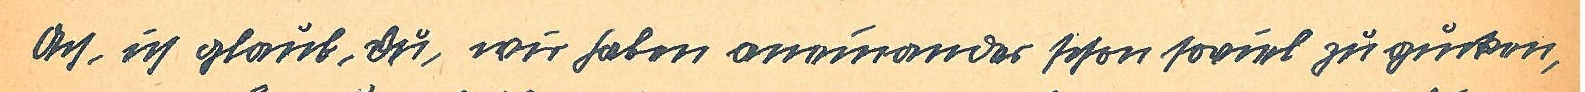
Ach, ich glaub, Du, wir haben aneinander schon so viel zu gucken,
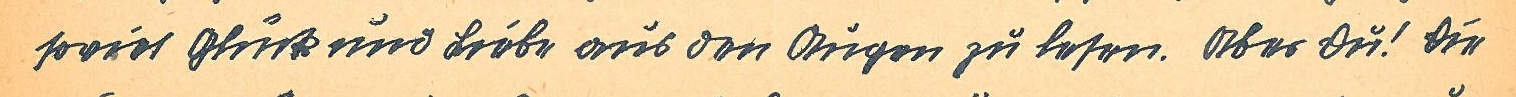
soviel Glück und Liebe aus den Augen zu lesen. Aber Du! Die
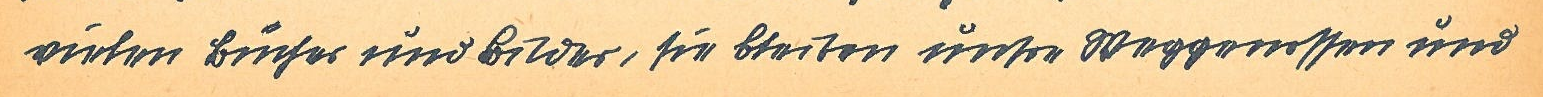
vielen Bücher und Bilder, sie bleiben unsre Weggenossen und
